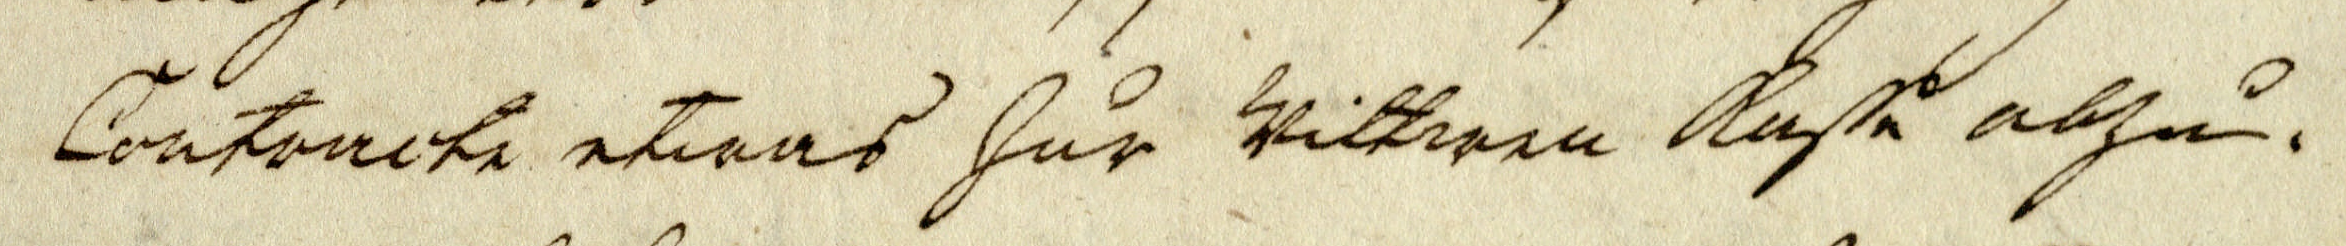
Contracte etwas zur Wittwen Kasse abzu¬
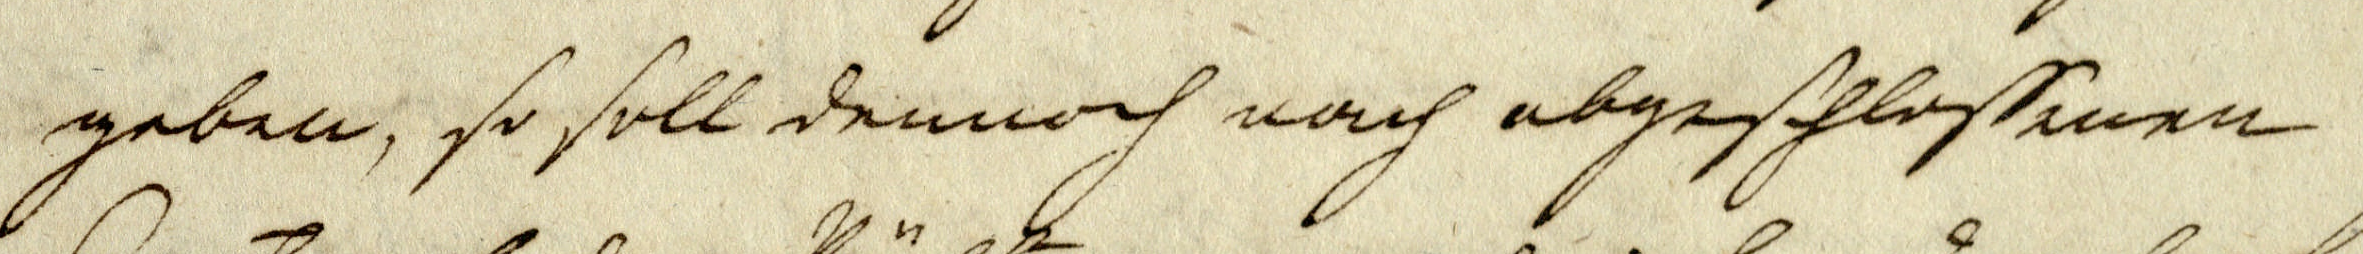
geben, so soll dennoch nach abgeschlossenen
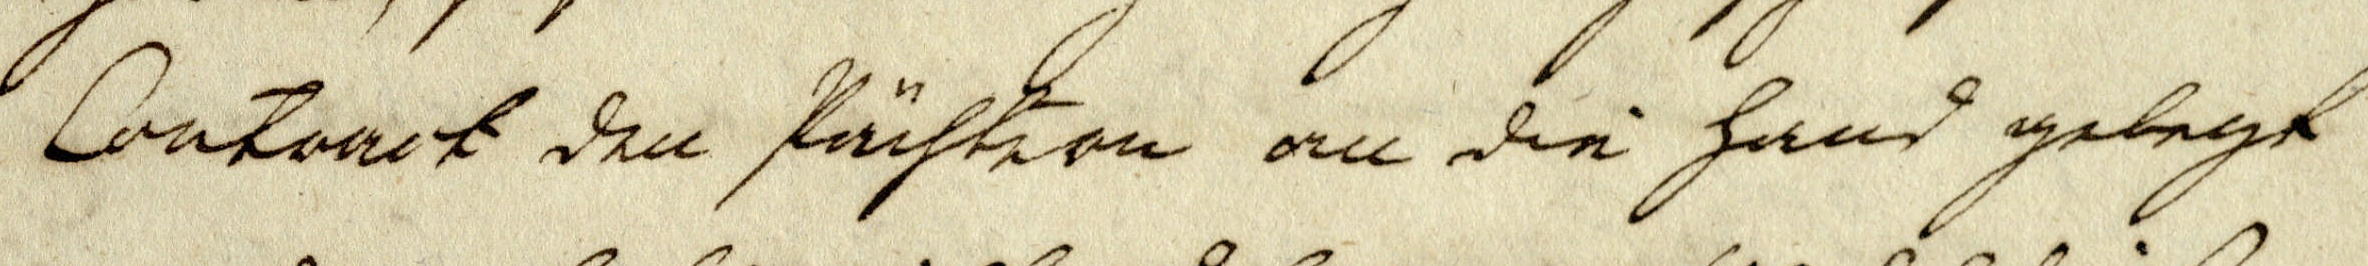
Contract den Pächtern an die Hand gelegt
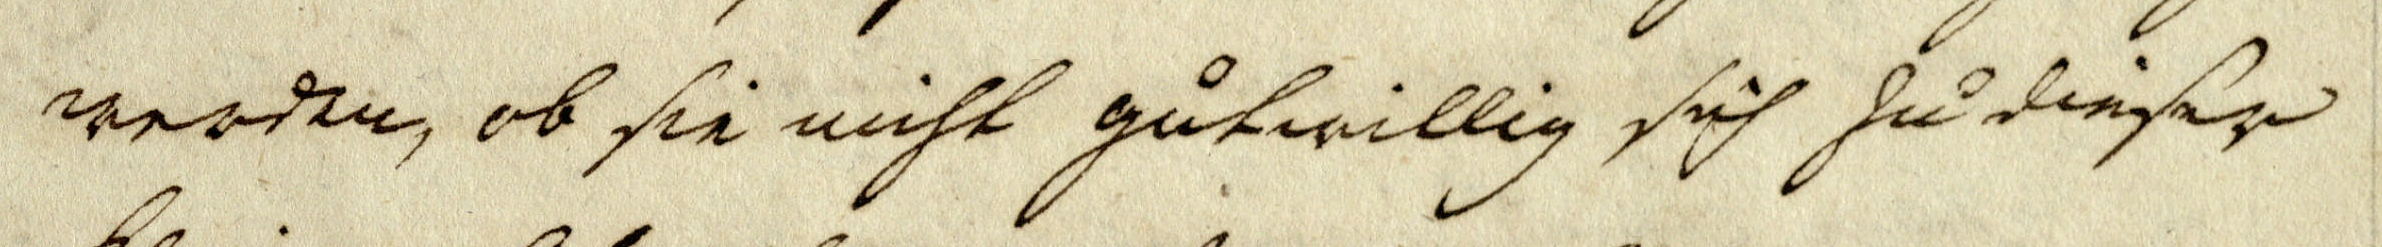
werden, ob sie nicht gutwillig sich zu dieser
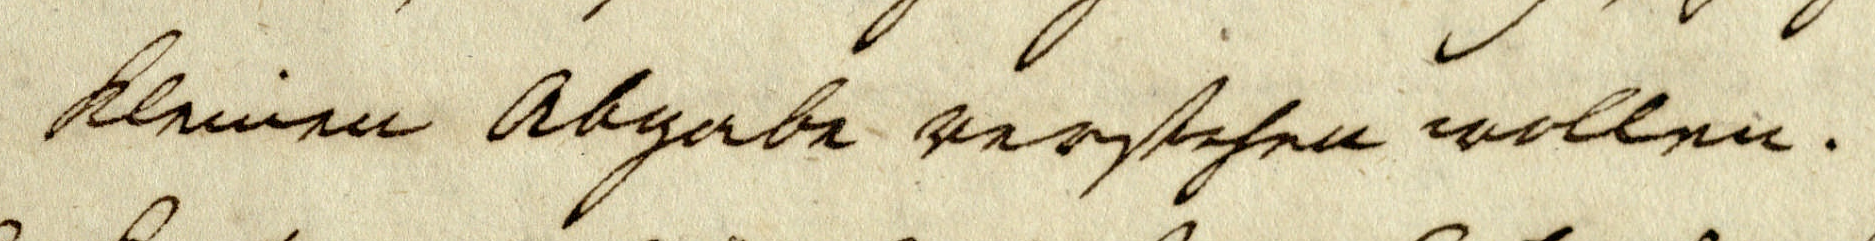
kleinen Abgabe verstehen wollen.
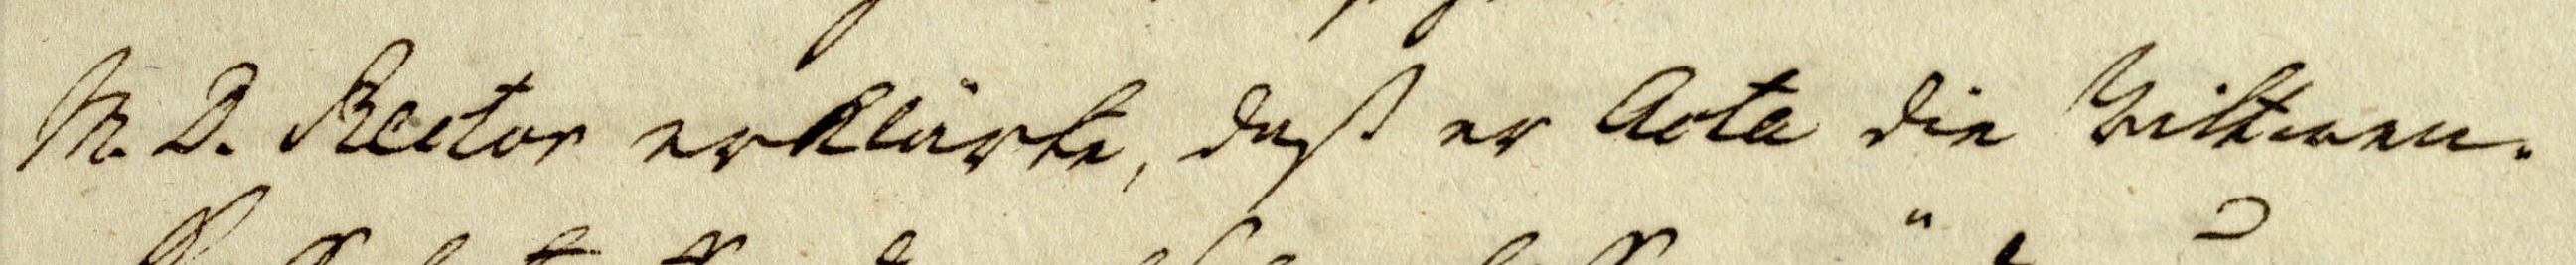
M. D. Rector erklärte, daß er Acta die Wittwen¬
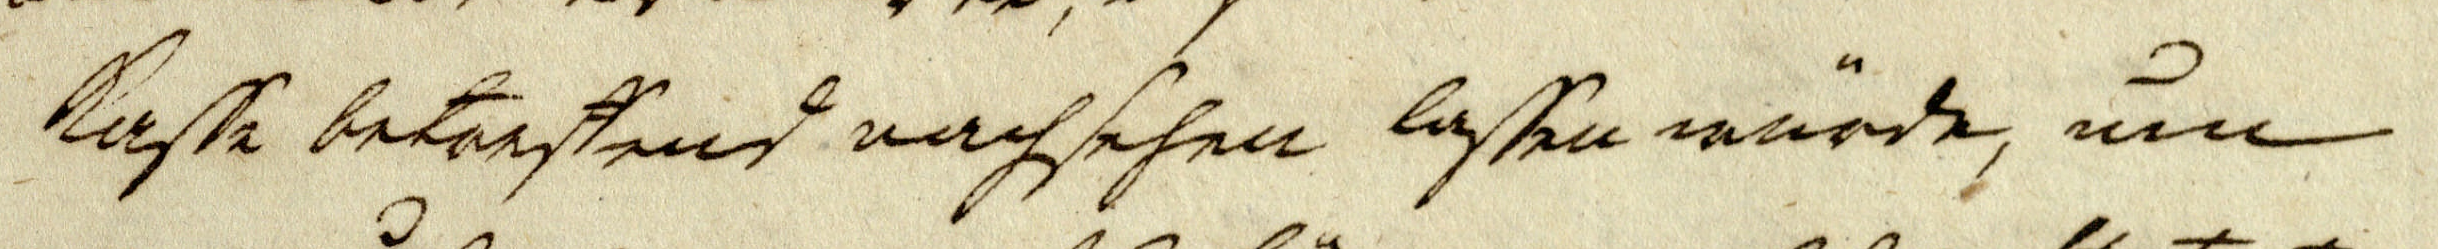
Kasse betreffend nachsehen lassen würde, um
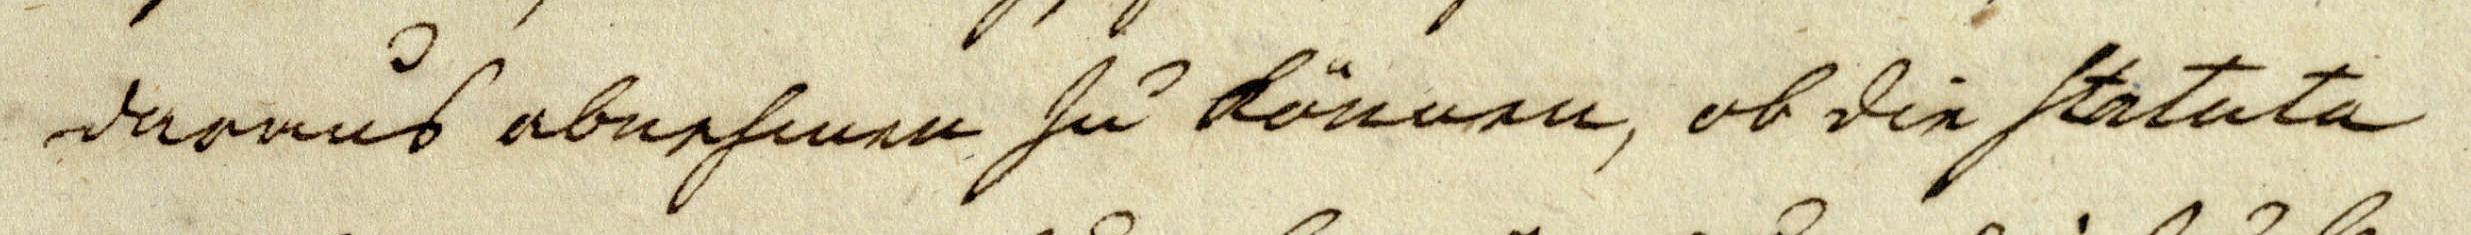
daraus abnehmen zu können, ob die statuta
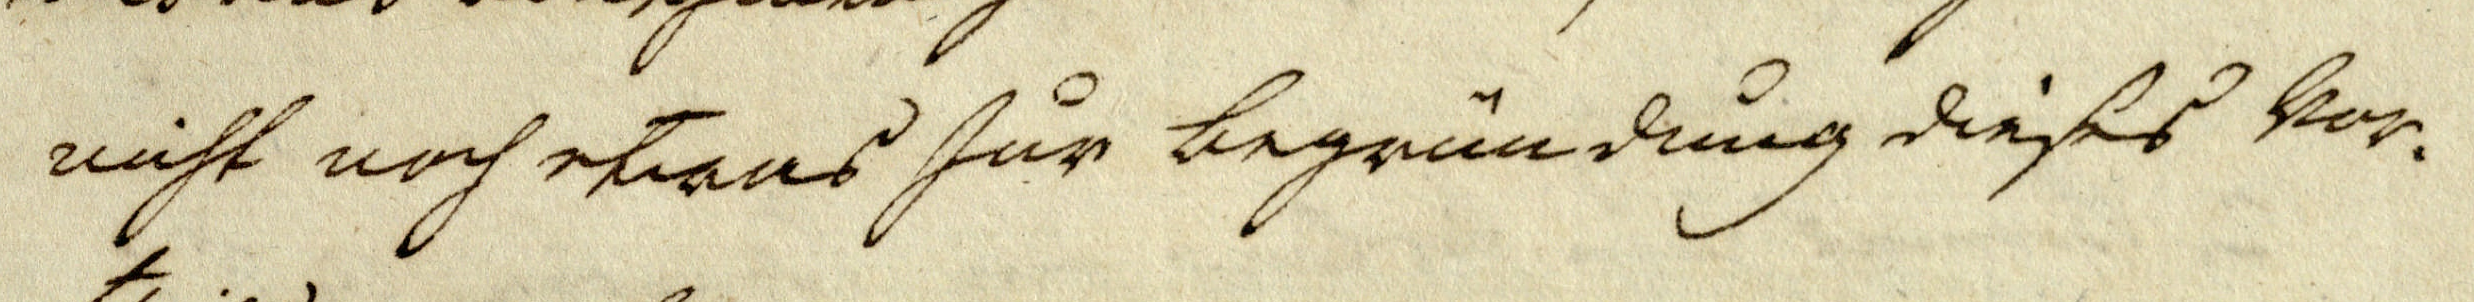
nicht noch etwas zur Begründung dieses Vor¬
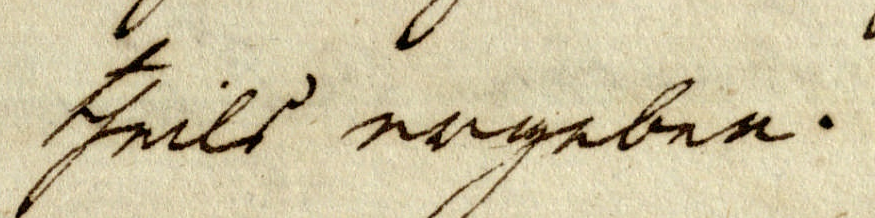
theils ergeben.
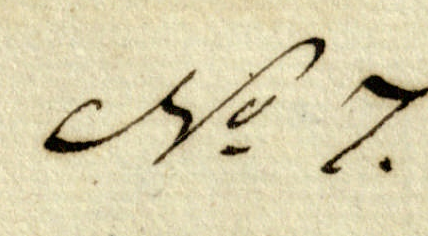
No 7.
